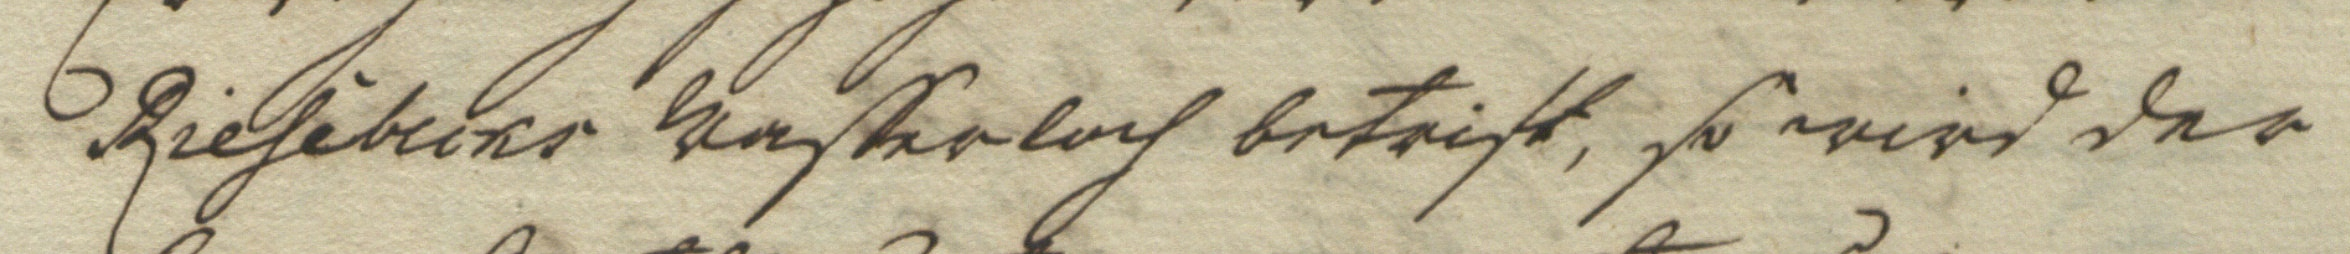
Riesebecker Wasserloch betrift, so wird der
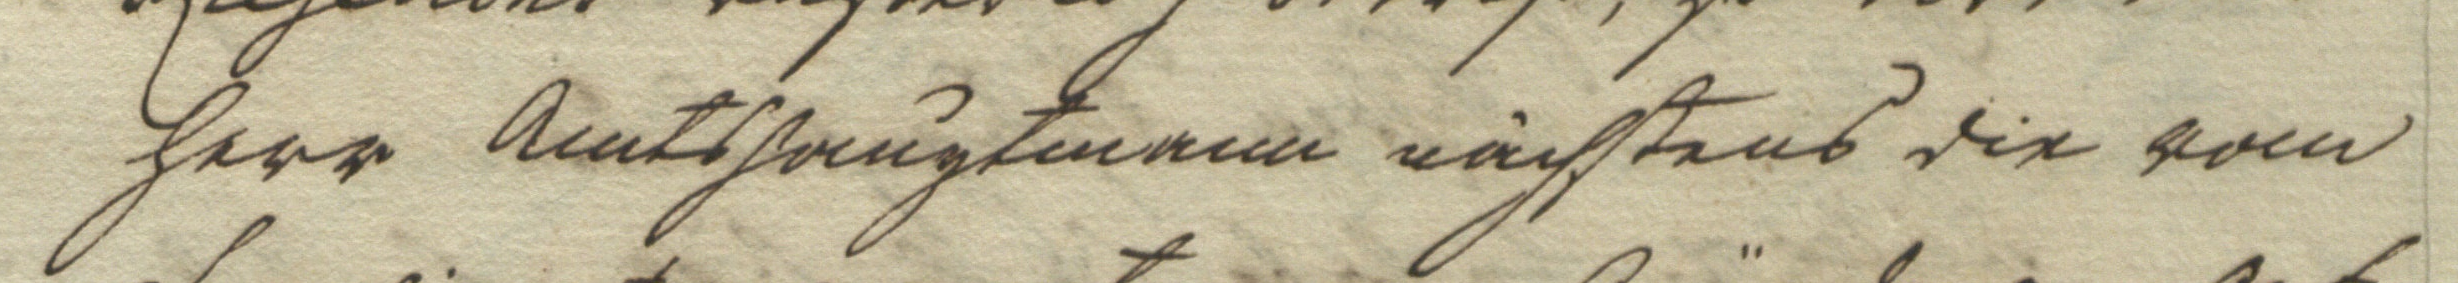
Herr Amtshauptmann nächstens die vom
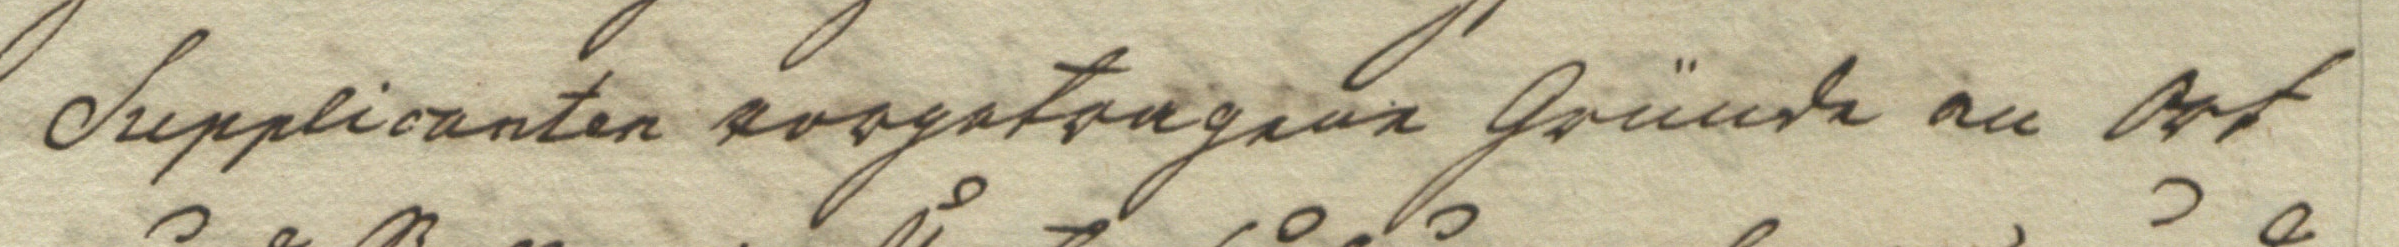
Supplicanten vorgetragene Gründe an Ort
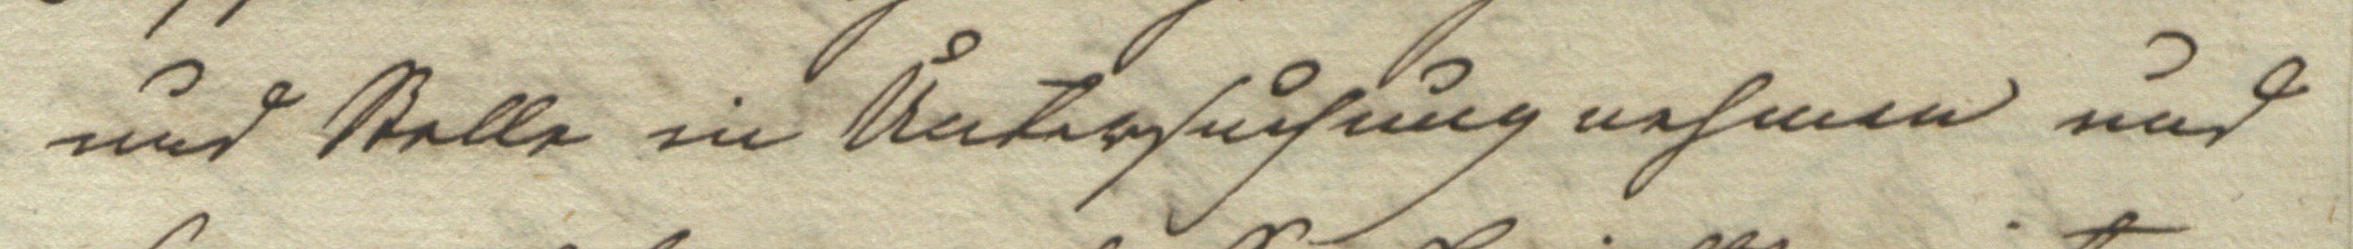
und Stelle in Untersuchung nehmen und
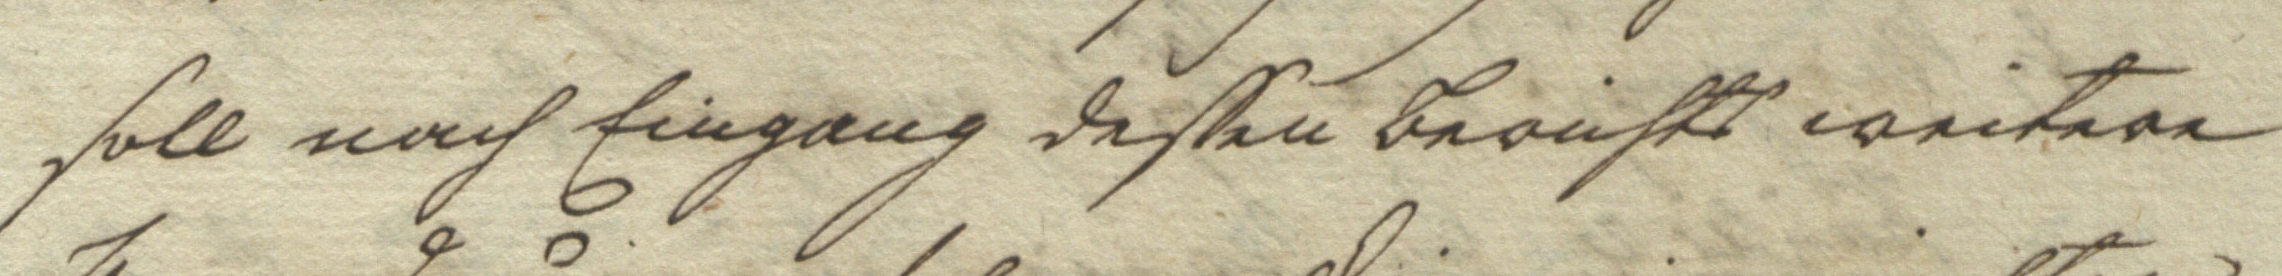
soll nach Eingang dessen Berichts weitere
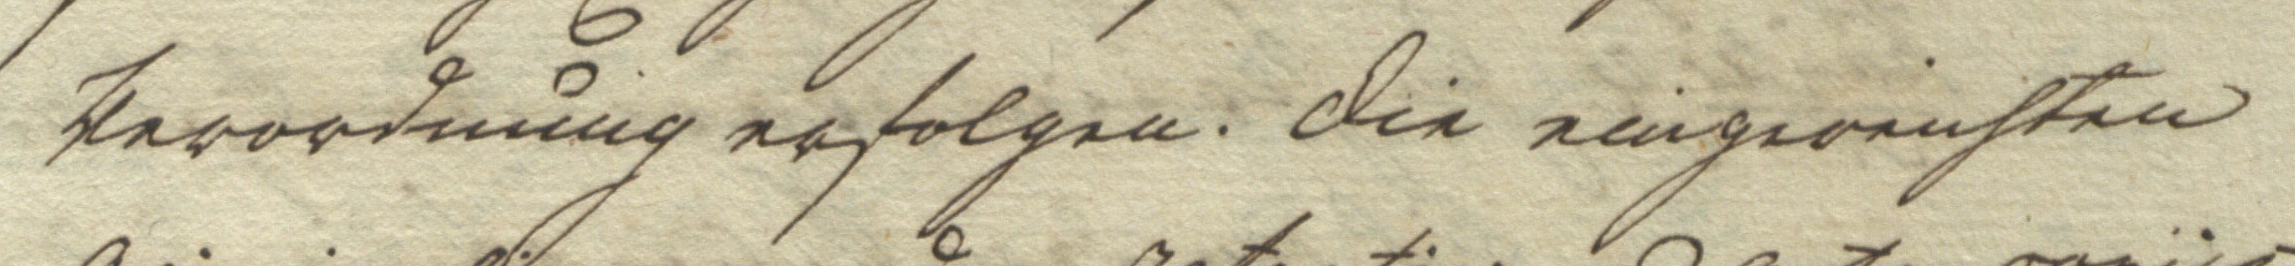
Verordnung erfolgen. Die eingereichten
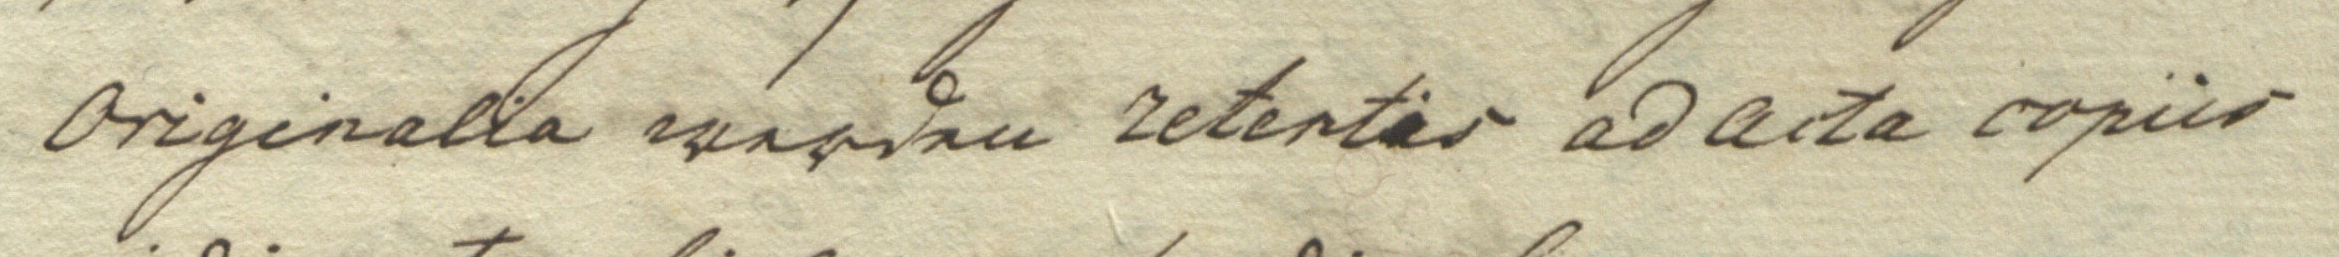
Originalle werden retertas ad acta copiis
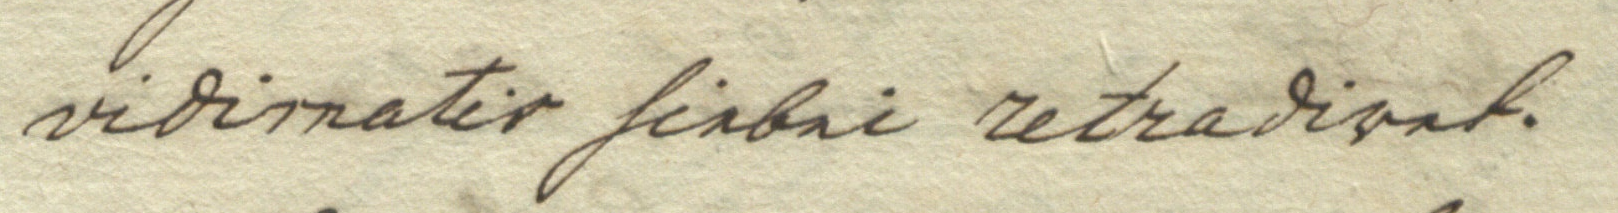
vidimatis hiebei ratradiret¬
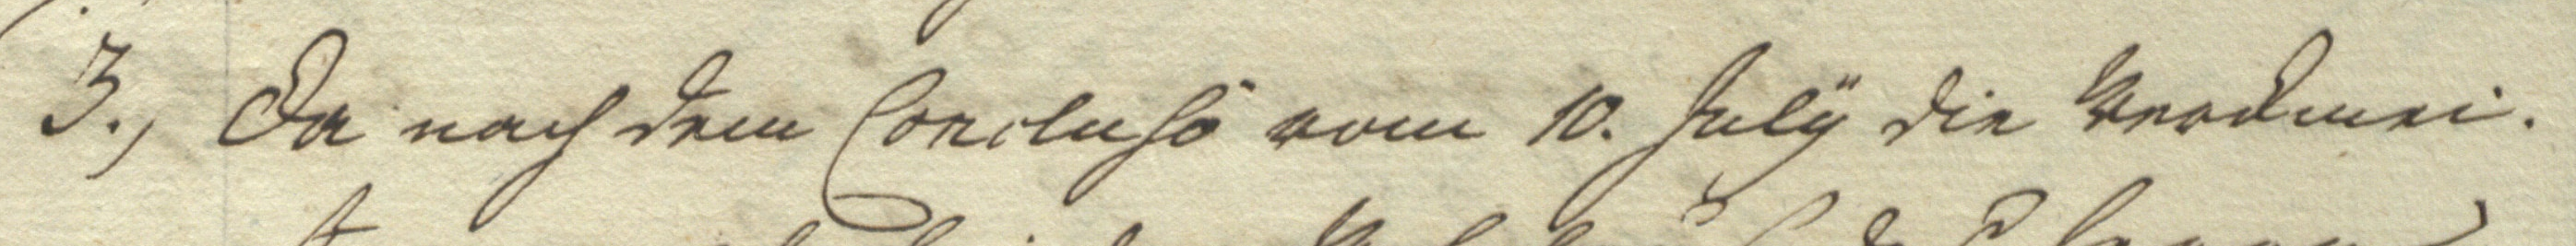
3., Da nach dem Concluso vom 10. Julÿ die Werckmei¬
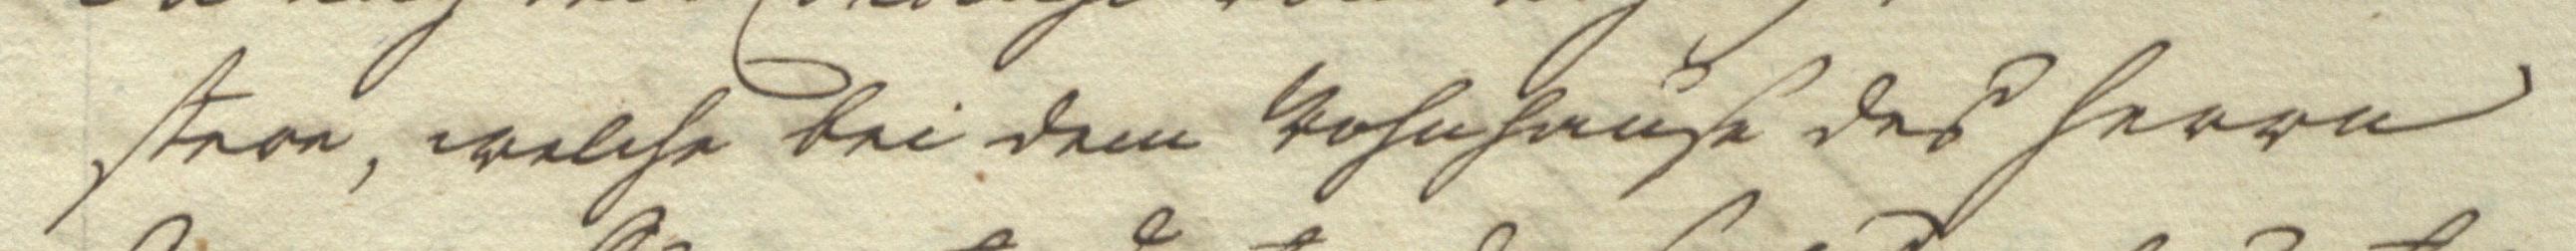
stern, welche bei dem Wohnhause des Herrn
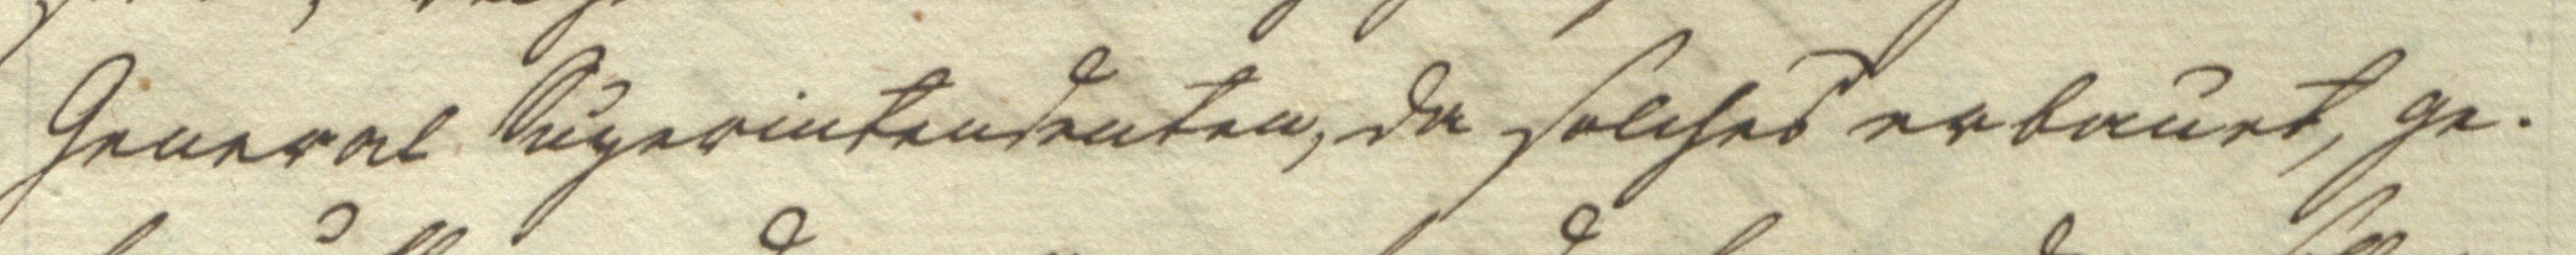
General Superintendenten, da solches erbauet, ge¬
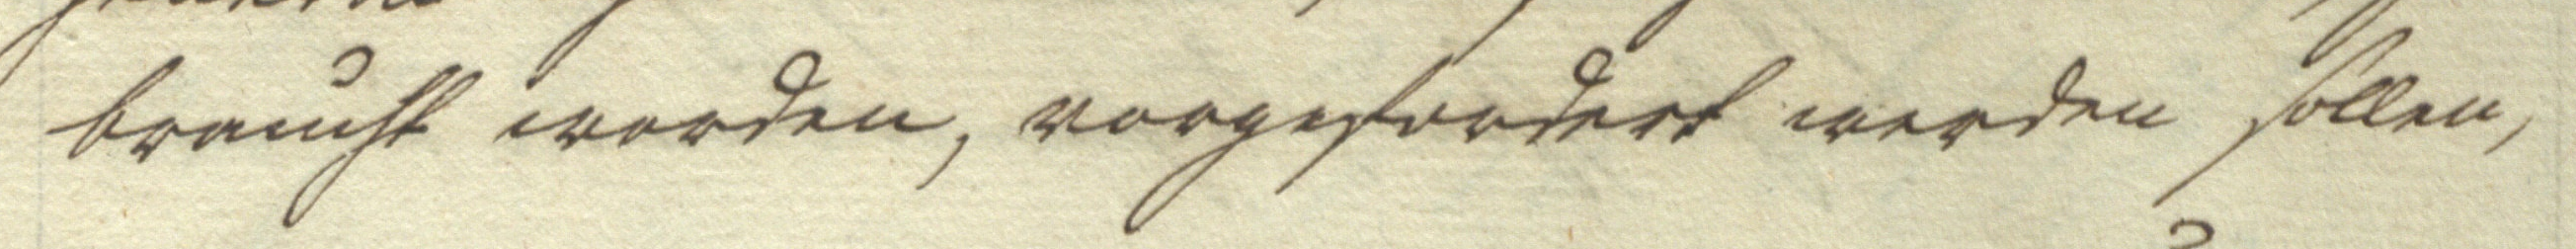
braucht worden, vorgefordert werden sollen,
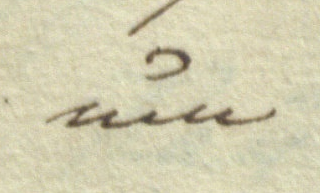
um
